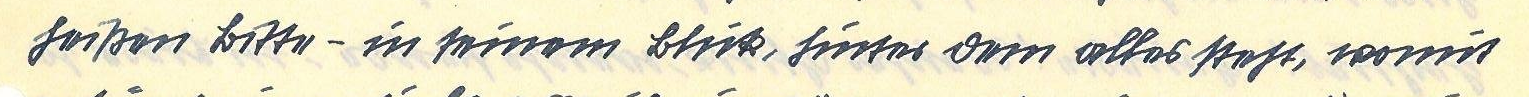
heißen Bitte – in seinem Blick, hinter dem alles steht, womit
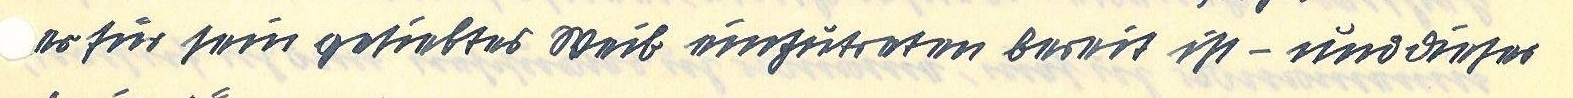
er für sein geliebtes Weib einzutreten bereit ist – und dieser
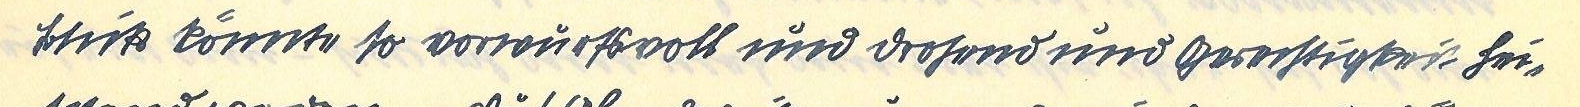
Blick könnte so vorwurfsvoll und drohend und Gerechtigkeit hei¬
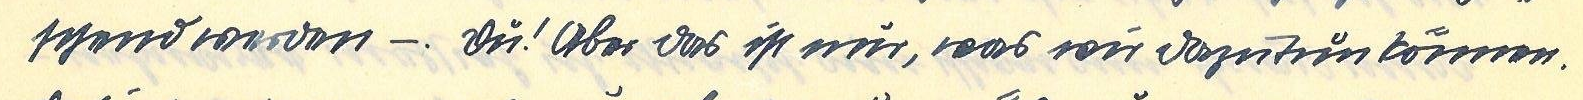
schend werden –. Du! Aber das ist nur, was wir dazutun können.
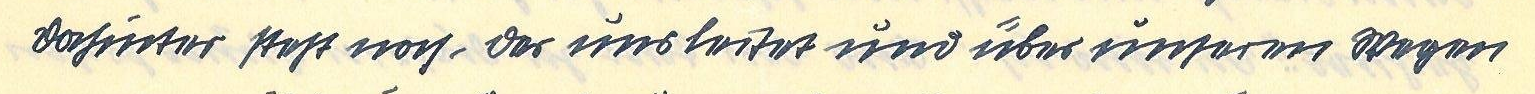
Dahinter steht noch, der uns leitet und über unseren Wegen
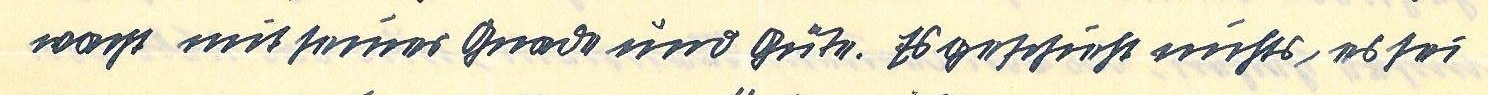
wacht mit seiner Gnade und Güte. Es geschieht nichts, es sei
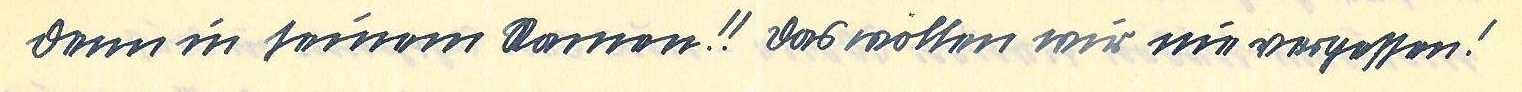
denn in seinem Namen!! Das wollen wir nie vergessen!
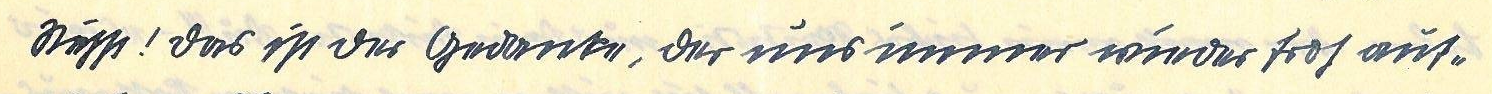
Siehst! Das ist der Gedanke, der uns immer wieder froh auf¬
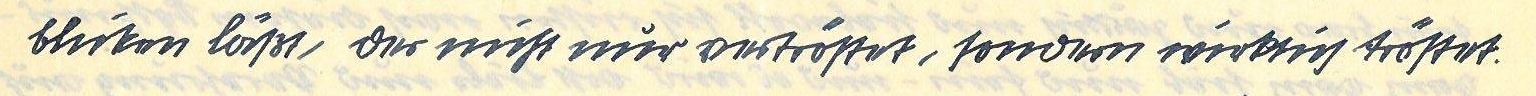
blicken läßt, der nicht nur vertröstet, sondern wirklich tröstet.
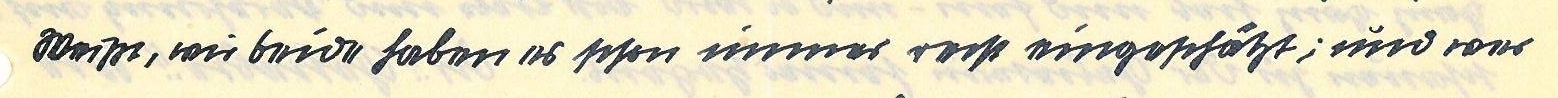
Weißt, wir beide habe es schon immer recht eingeschätzt; und wer
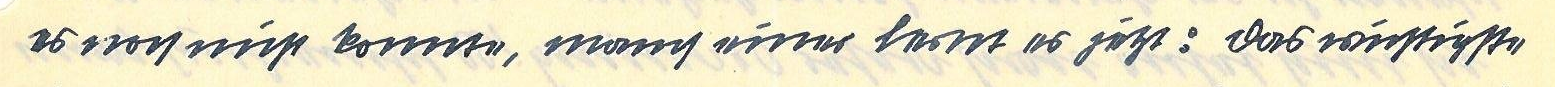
es noch nicht konnte, manch einer lernt es jetzt: das wichtigste
